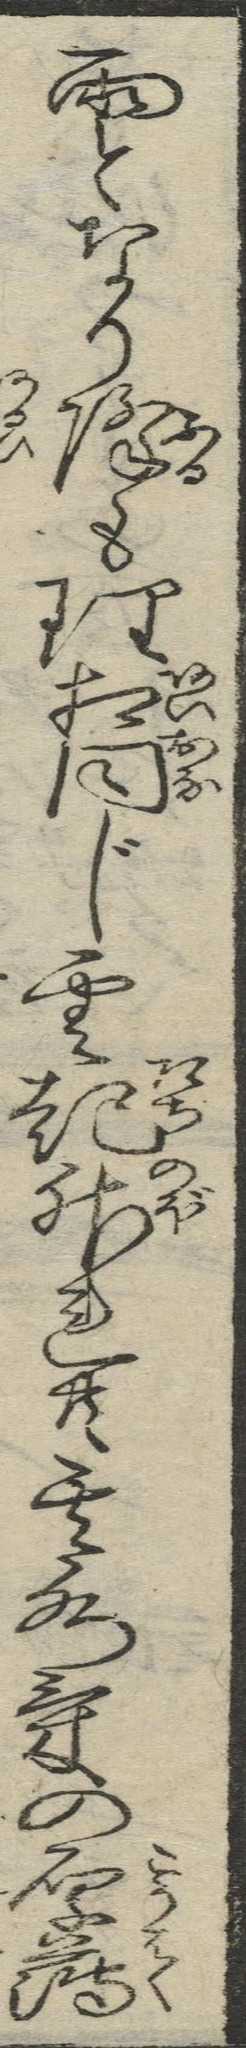雨となり降も理相同じ雲起升れ共其水気の厚薄
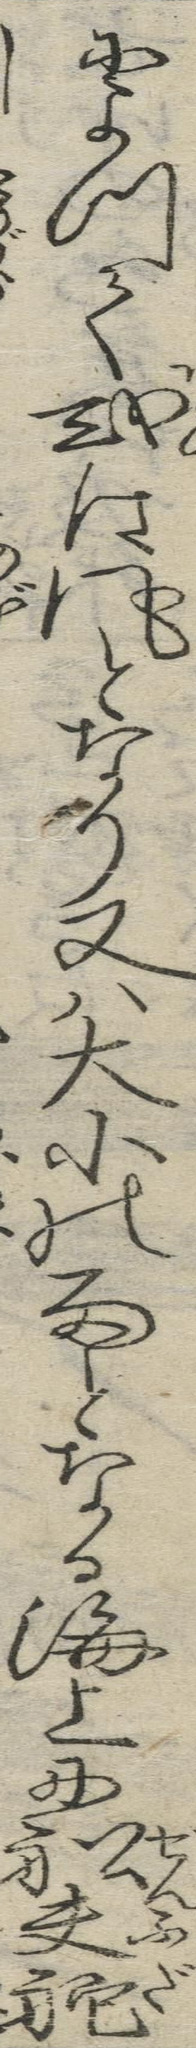によつて或は風となり又は大小の雨となる海上に船夫舵
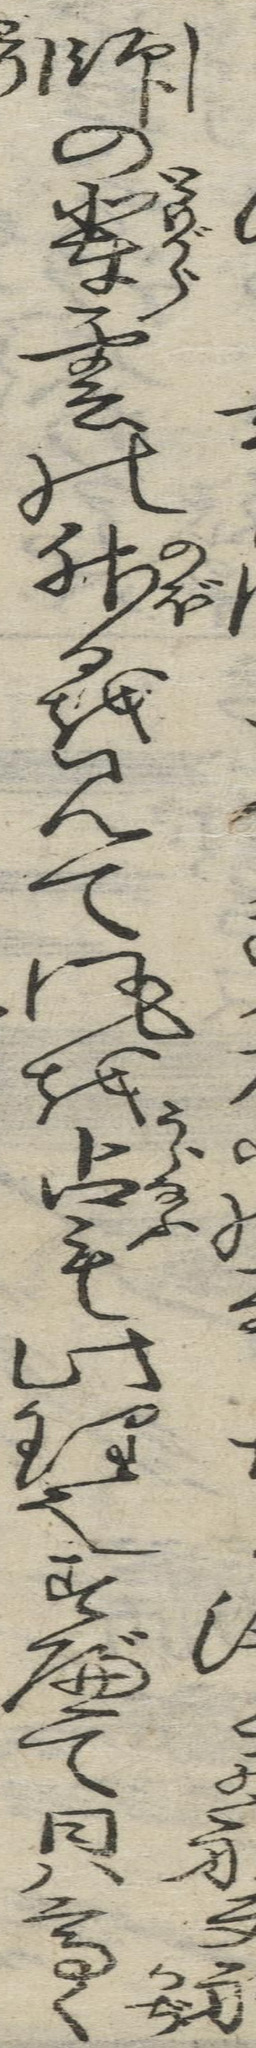師の輩雲の升るを見て風を占も此理也すべて日は高く
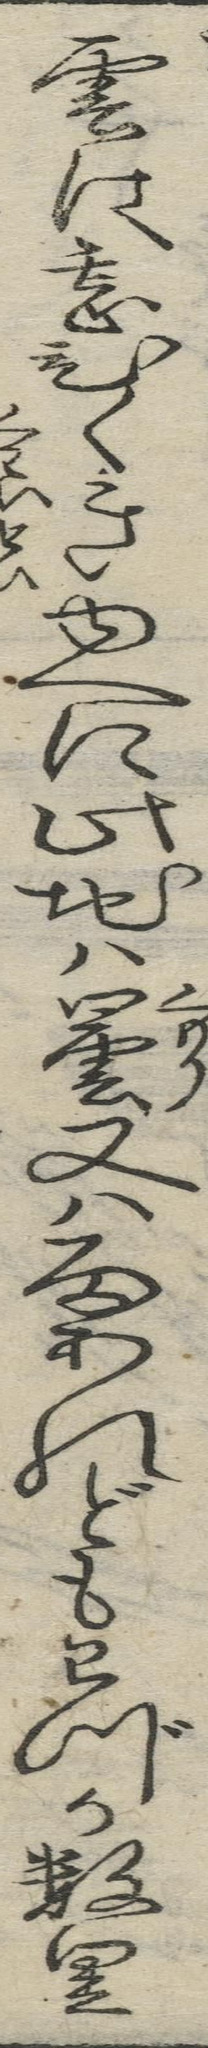雲は甚ひくきゆへに此地は曇又は雨あれどもわづか数里
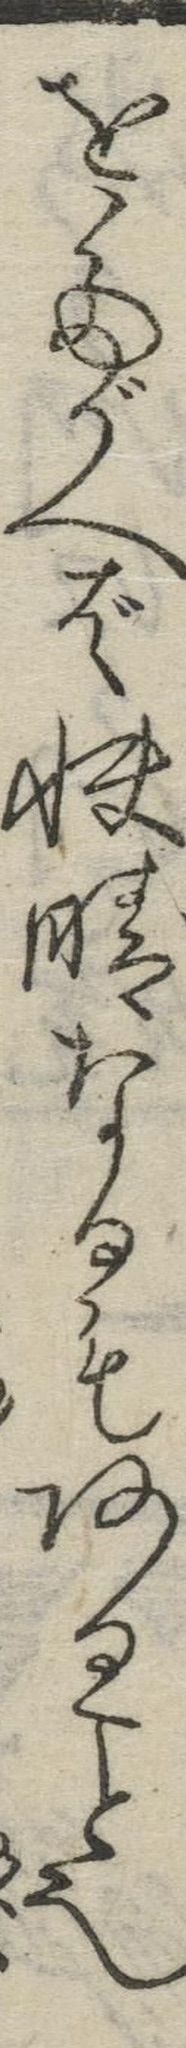をたがへば快晴なるもありと也
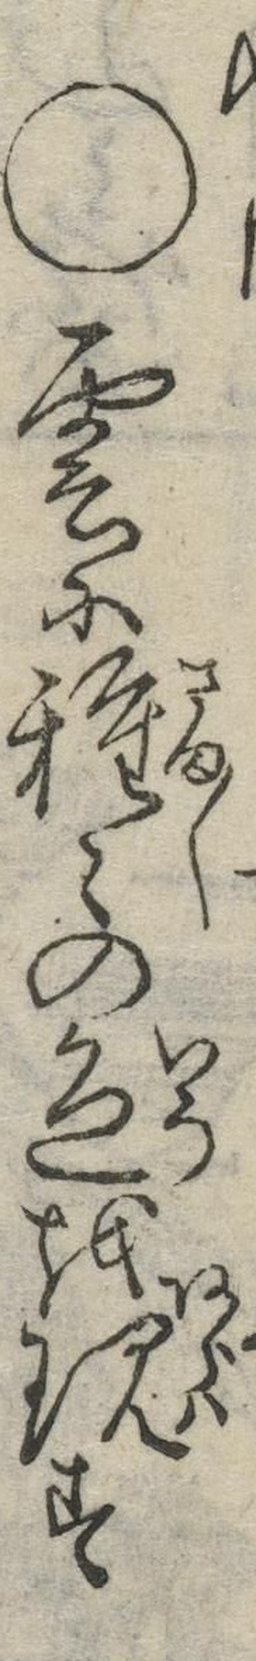〇雲に種々の色を現す
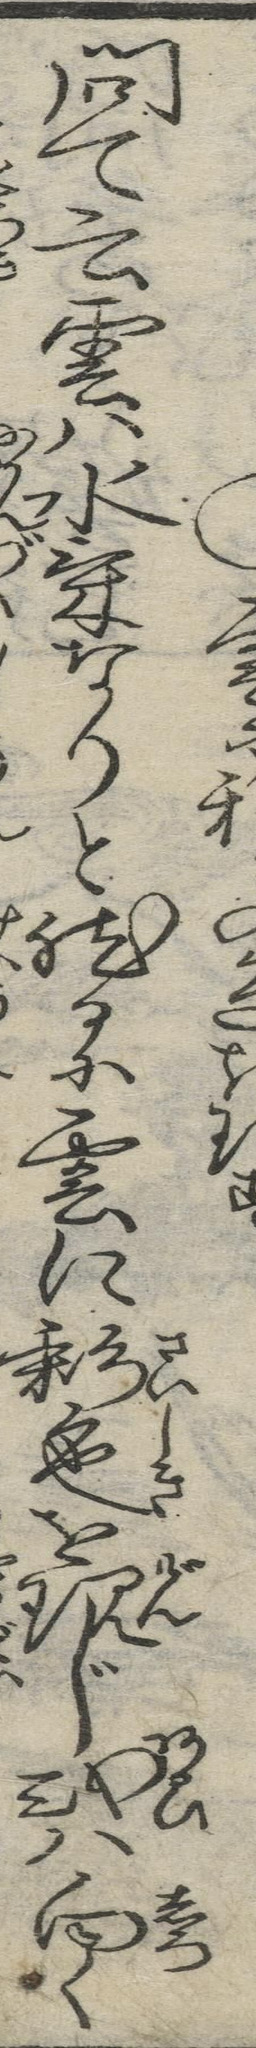問て云雲は水気なりと然るに雲に彩色を現じ或は白く
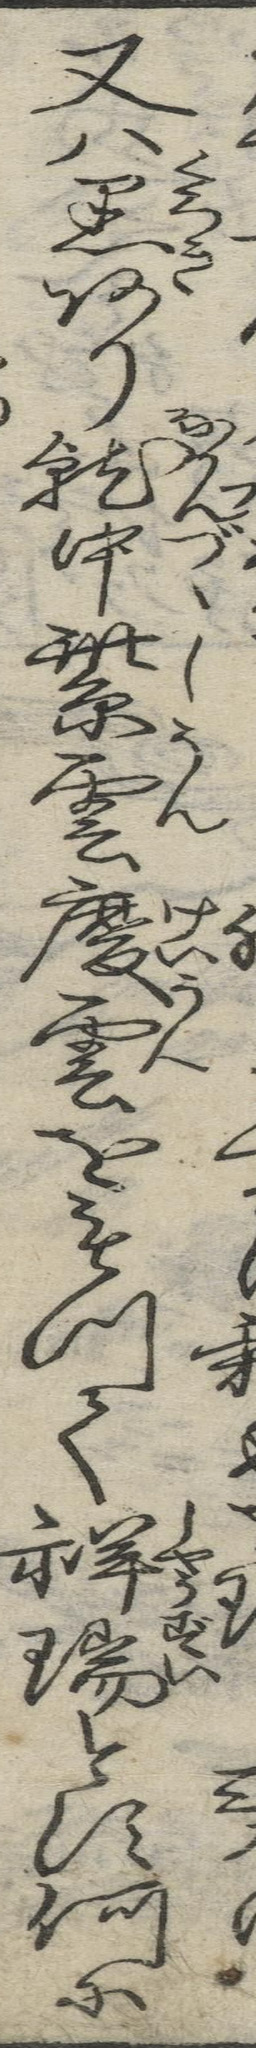又は黒あり就中紫雲慶雲をもつて祥瑞とす何に
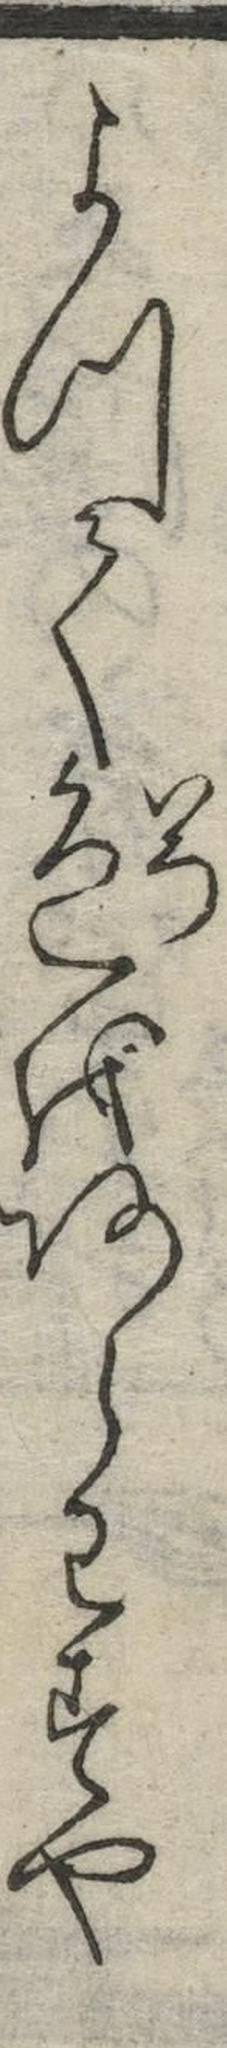よつて色をあらわすや
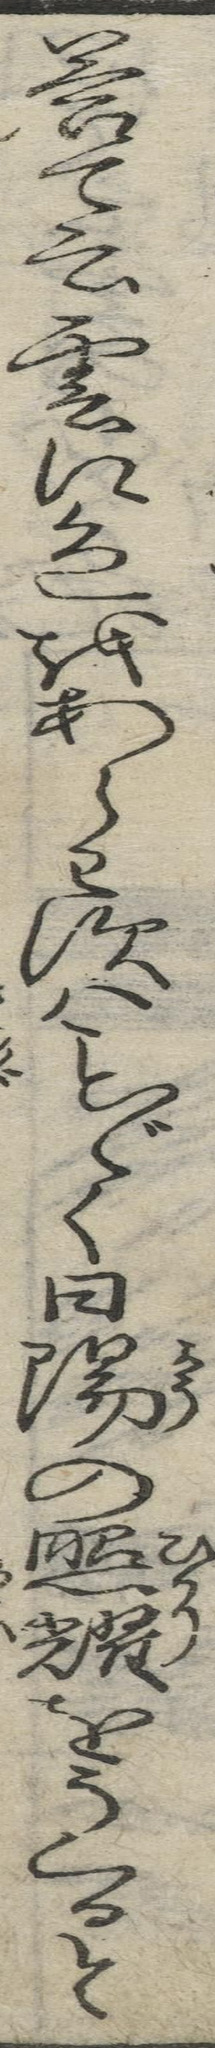答て云雲に色をあらわすはこと〴〵く日陽の照耀をうくると
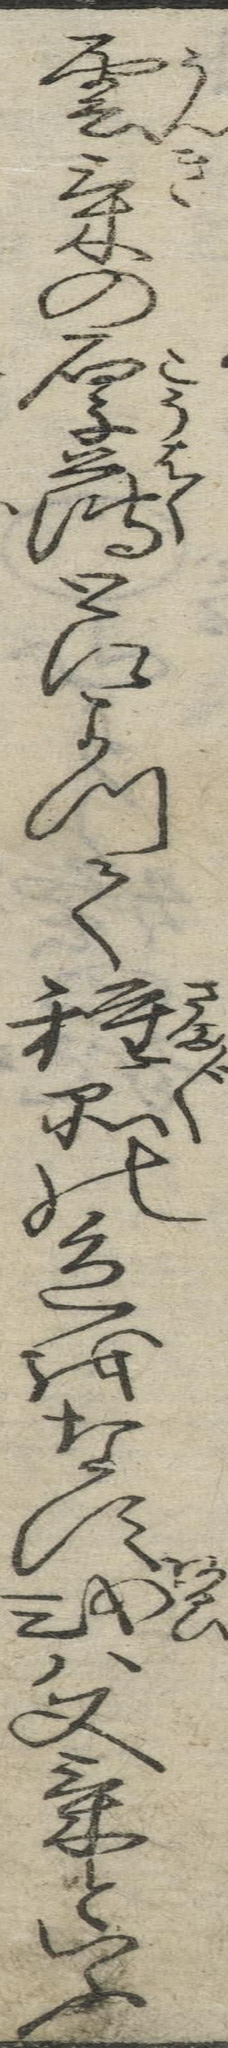雲気の厚薄とによつて種品の色をなす或は又気といふ
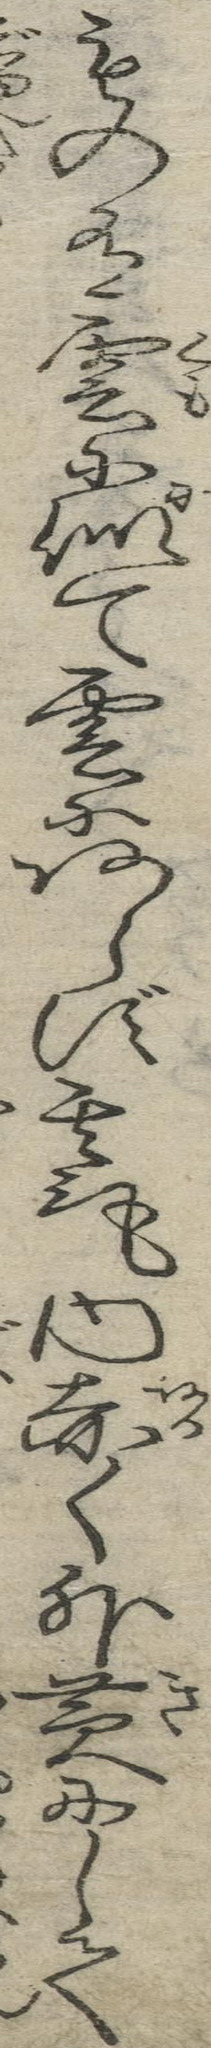もの有雲に似て雲にあらず其気内赤く外黄にして
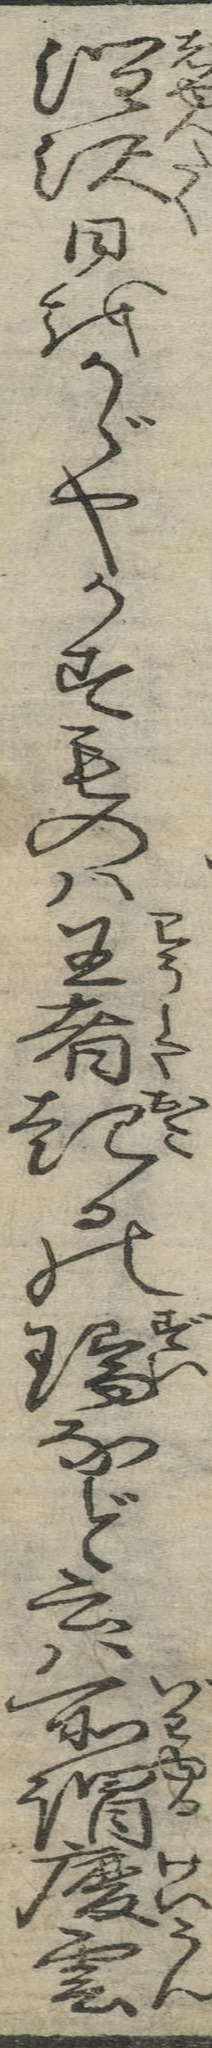潤沢日をかゞやかすものは王者起るの瑞など云は所謂慶雲

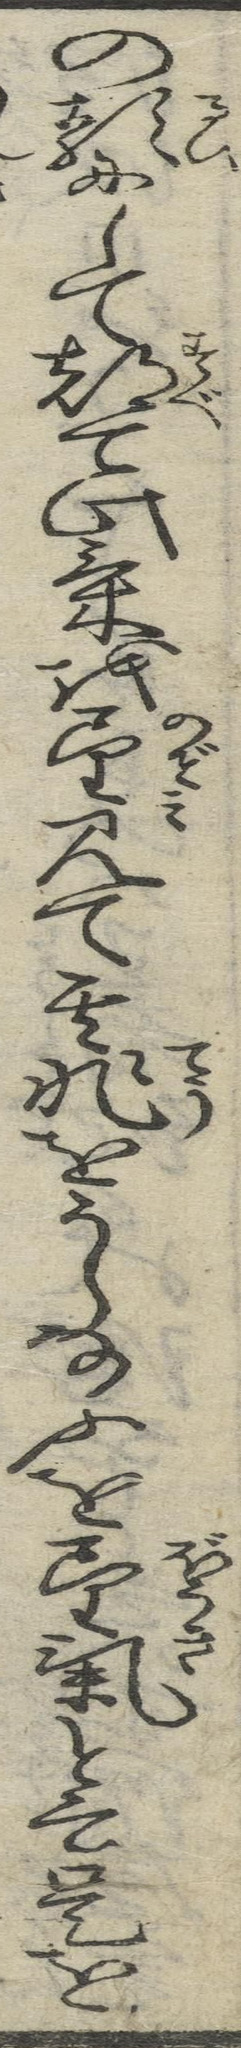の類にして都て此気を望見て其兆をうしなふを望気と云是を
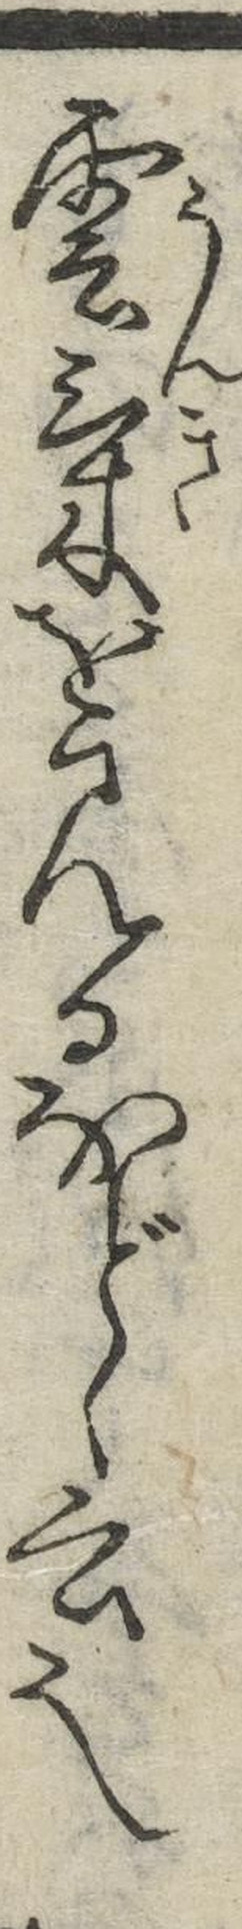雲気を見るなどゝ云也
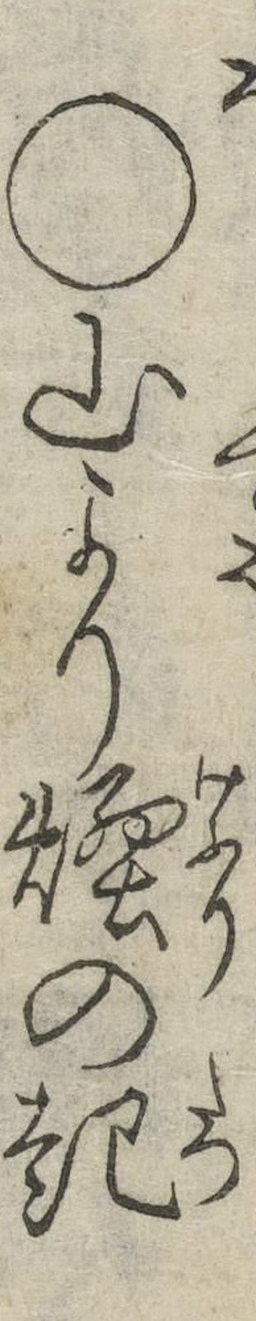〇山より煙の起
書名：訓蒙天地辨　地
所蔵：東京大学地震研究所図書室 Earthquake Research Institute Library, The University of Tokyo, JAPAN
